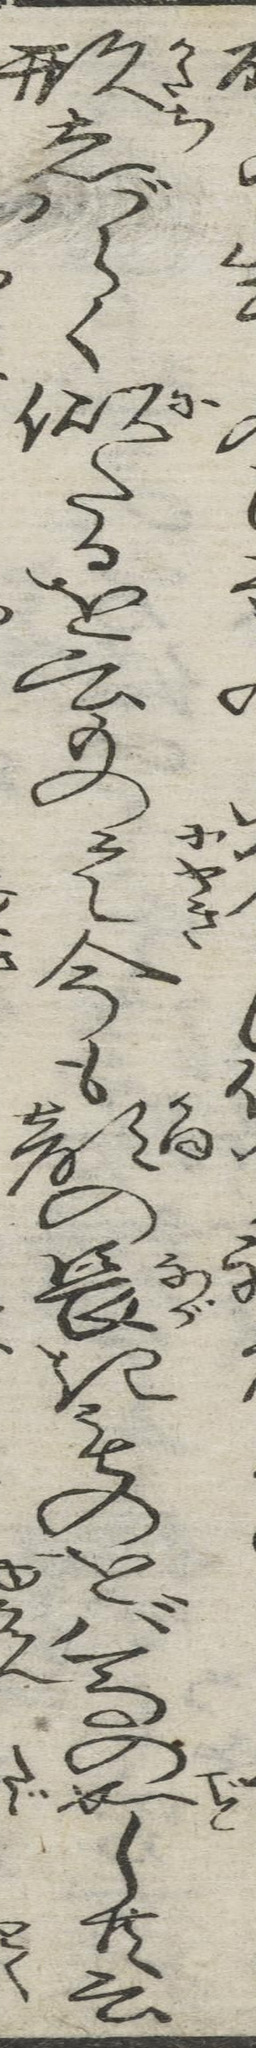形しばらく似たるを云ものにて今も顔の長きものをば馬の如し共云
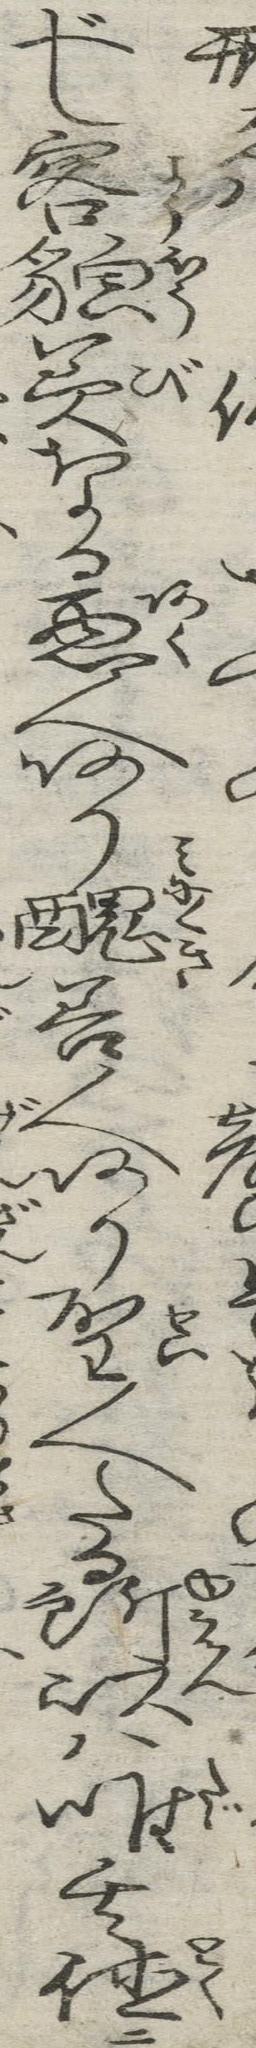べし容貌美なる悪人あり醜善人あり聖人たる所以は唯其徳に
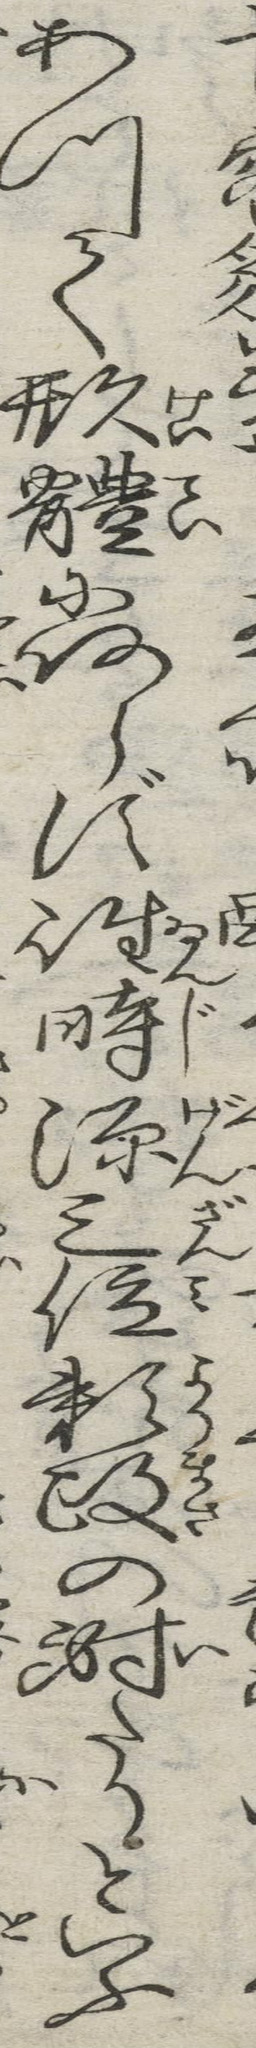あつて形体にあらず往時源三位頼政の射たりといふ
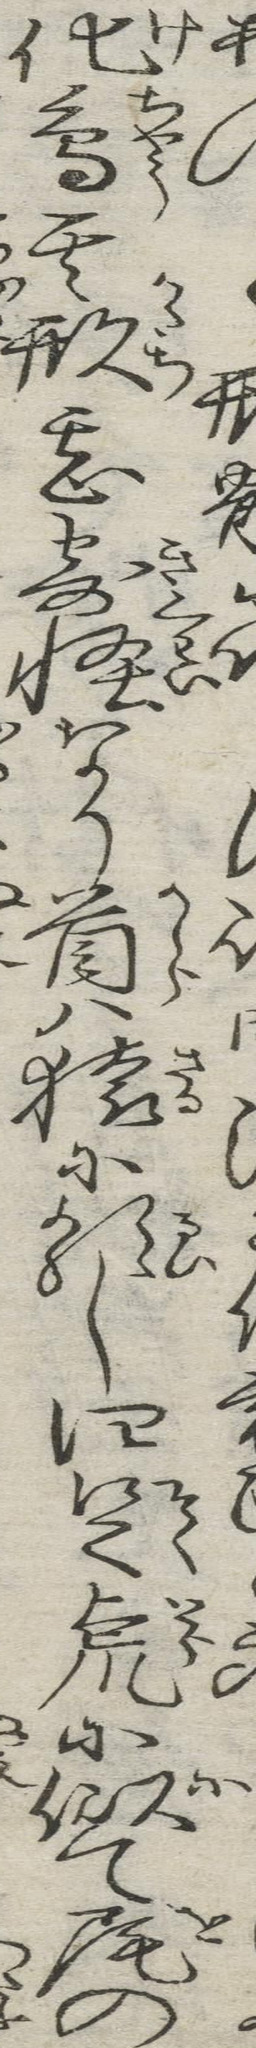化鳥其形甚奇怪なり首は猿に類し四足虎に似て尾の
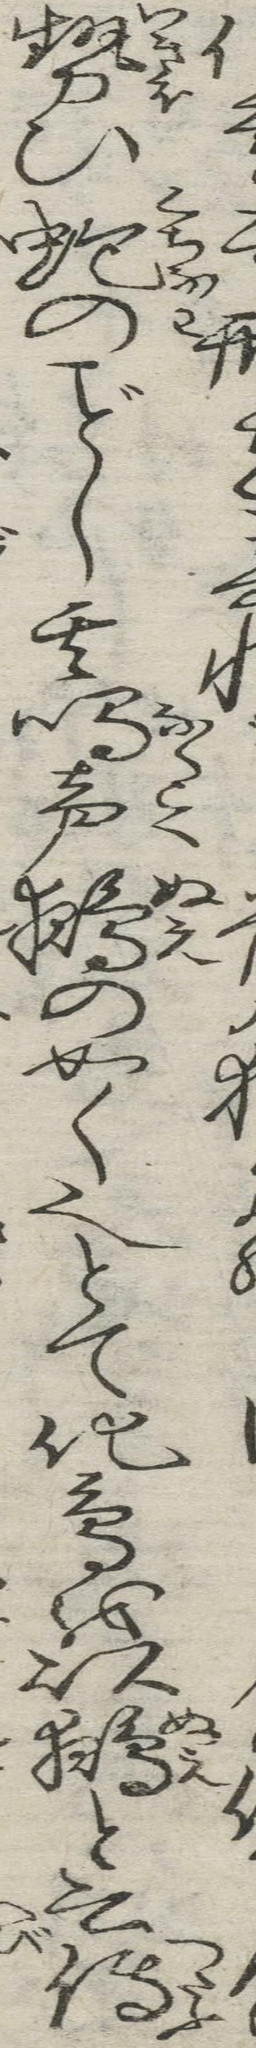勢ひ蛇のごとし其鳴声鵺の如く也とて化鳥を以鵺と云伝
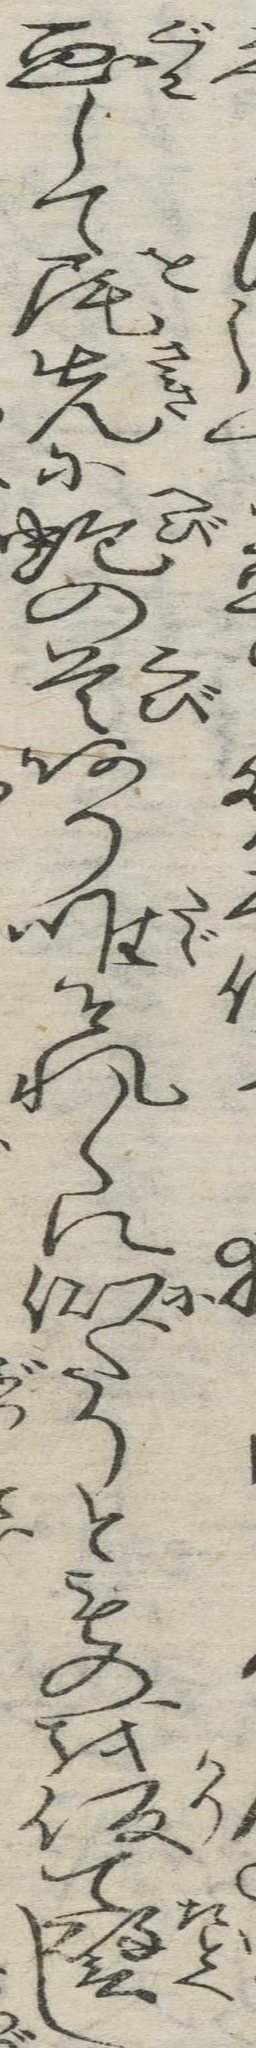画して尾先に蛇の首あり唯それしらす似たりとものを仮て譬し
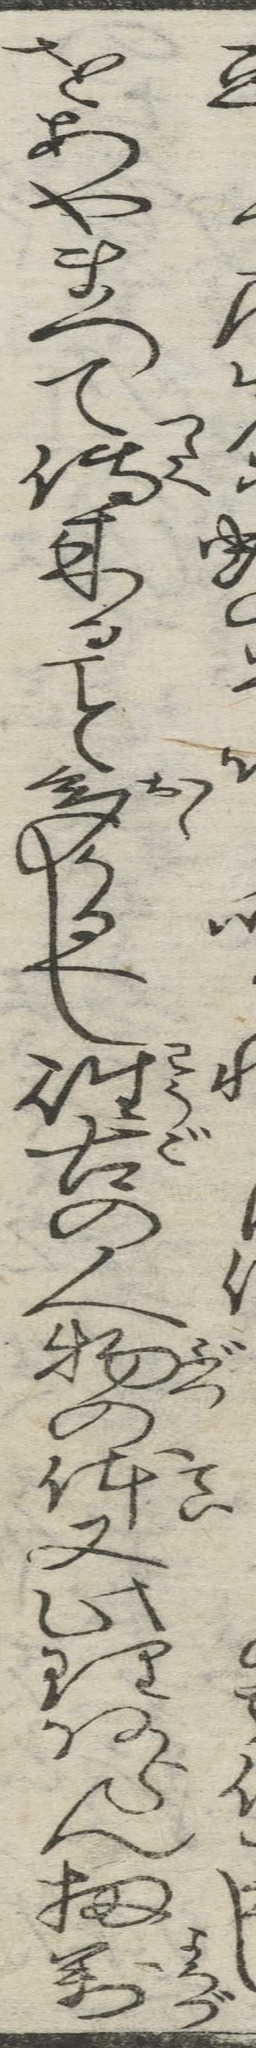をあやまつて伝来ること多かるへし往古の人物の体又此理あらん扨万
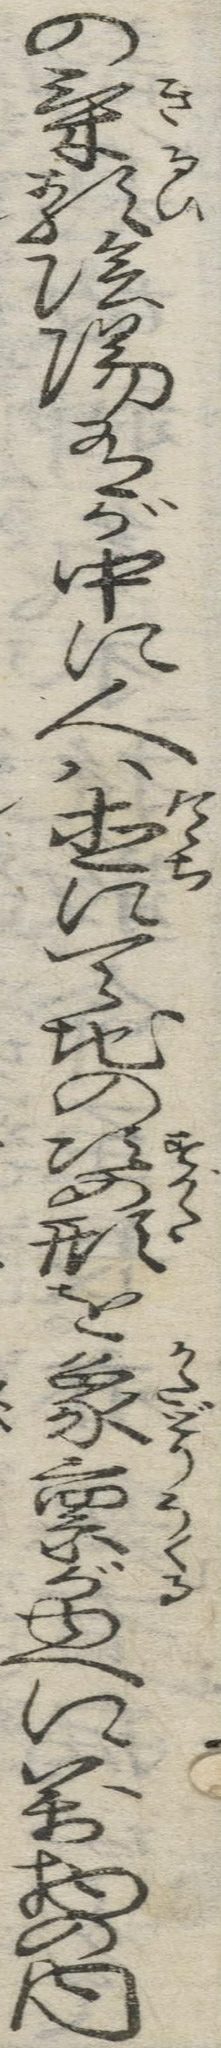の気類陰陽有が中に人は直に天地の姿形を象禀がゆへに万物の内
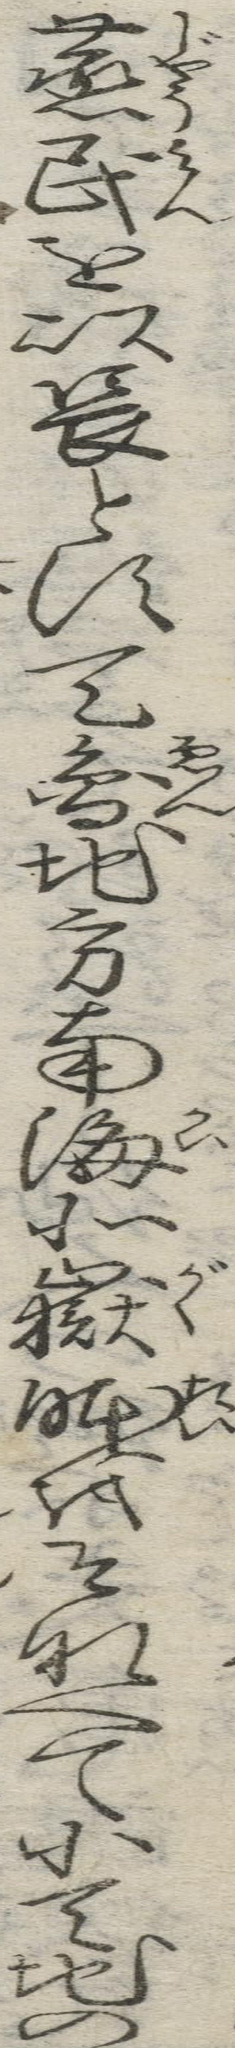蒸民を以長とす天円地方南海北嶽体をそなへて小天地の
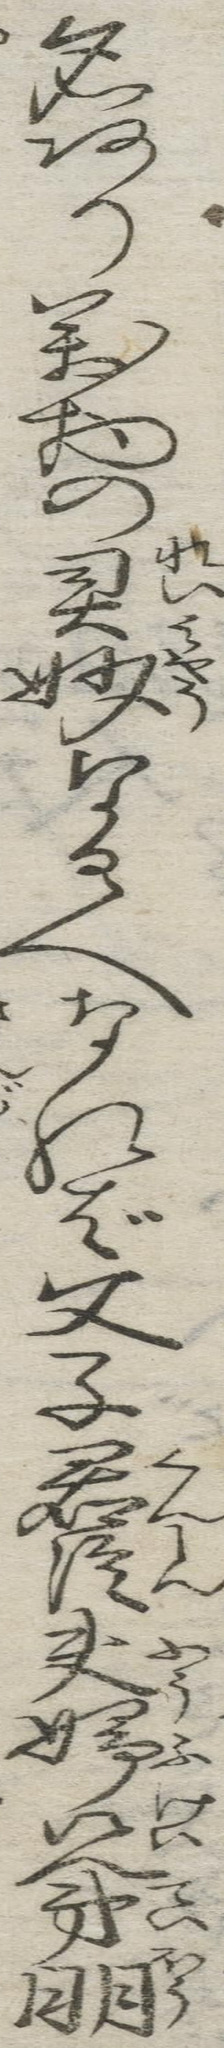名あり万物の霊妙なる人なれば父子君臣夫婦兄弟朋
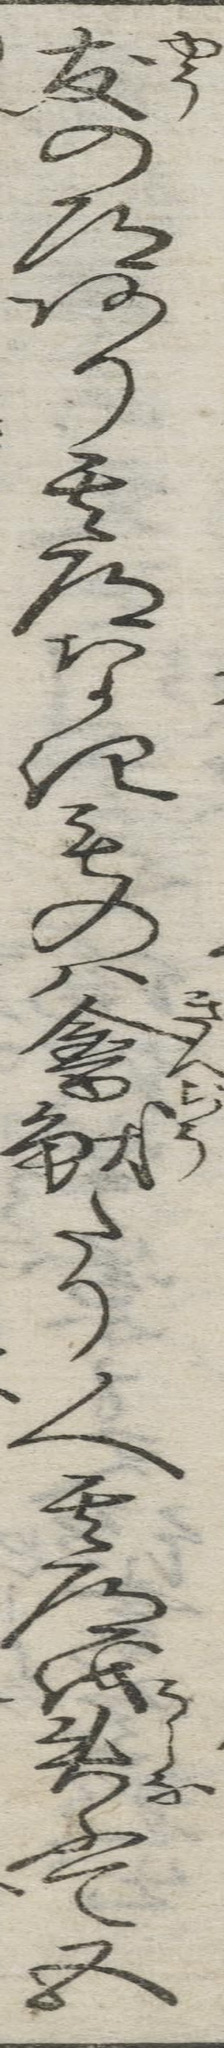友の道あり其道なきものは禽獣たり人其道を失ふて五
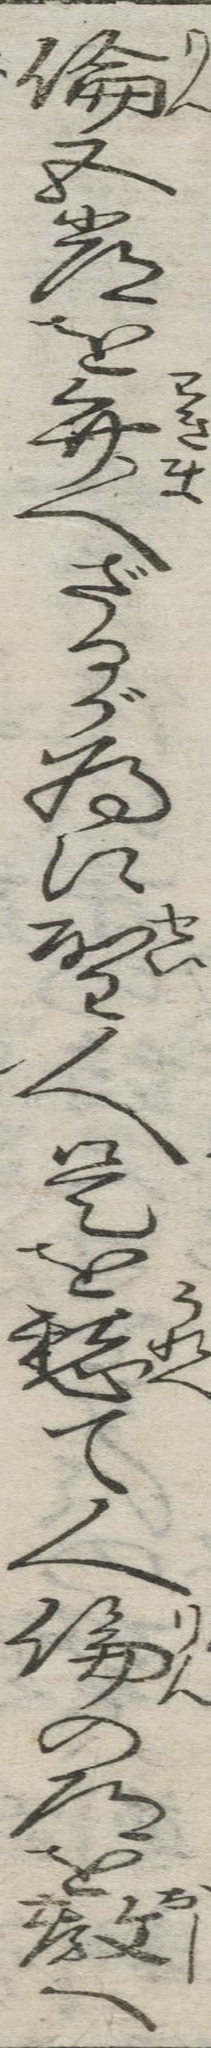倫五常を弁へざるが為に聖人是を愁て人倫の道を教へ
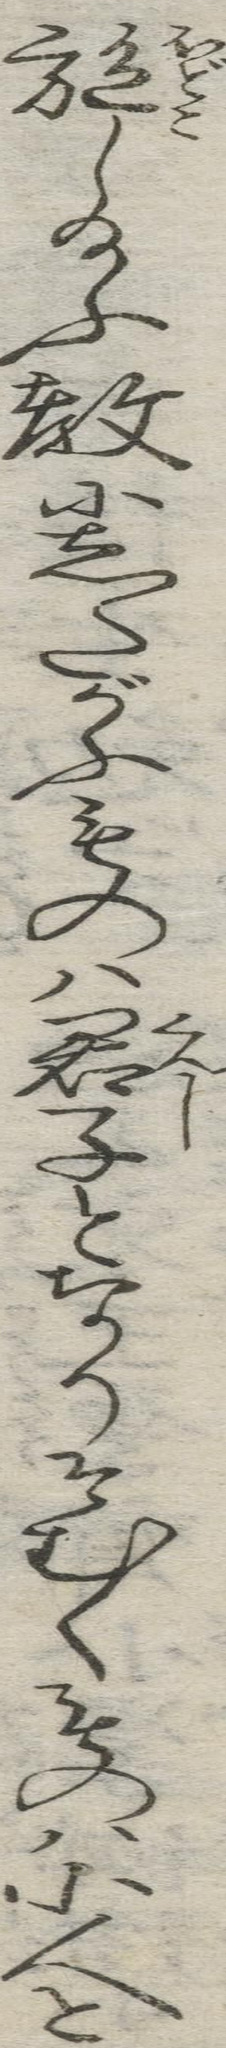施し給ふ教にしたがふものは君子となりそむくものは小人と
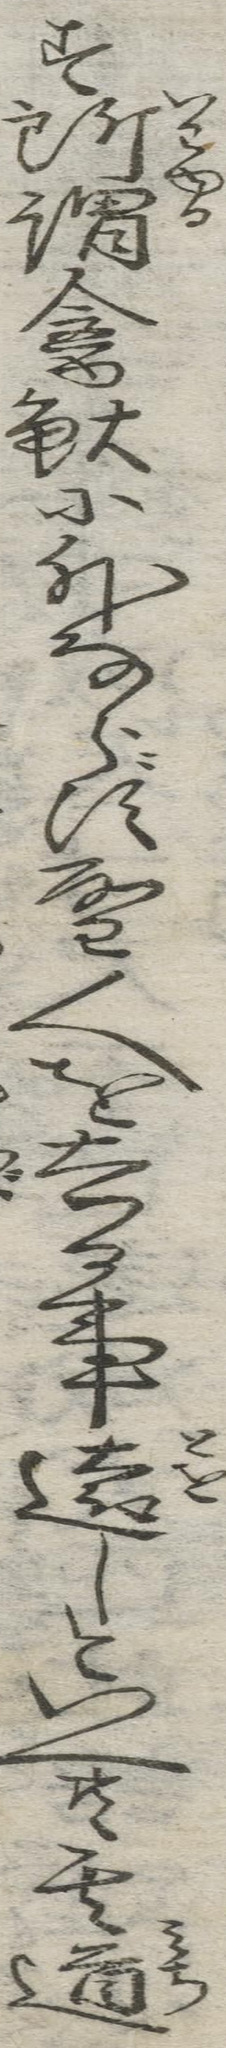す所謂禽獣に外ならず聖人を去る事遠しといへ共其道
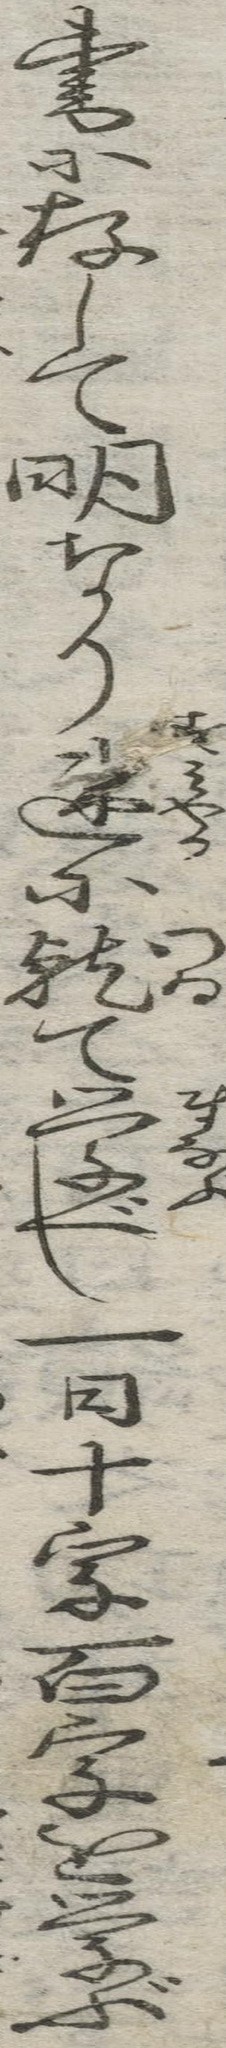書に存して明なり速に就て学べし一日十字百字を学ぶ
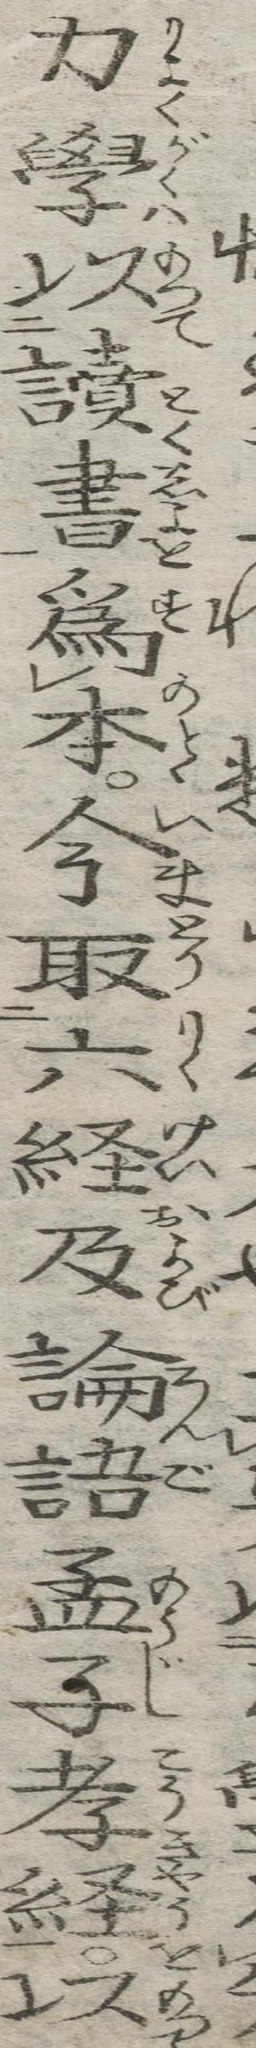力学以読書為本。今取六経及論語孟子孝経。以
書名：訓蒙天地辨　人
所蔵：東京大学地震研究所図書室 Earthquake Research Institute Library, The University of Tokyo, JAPAN
